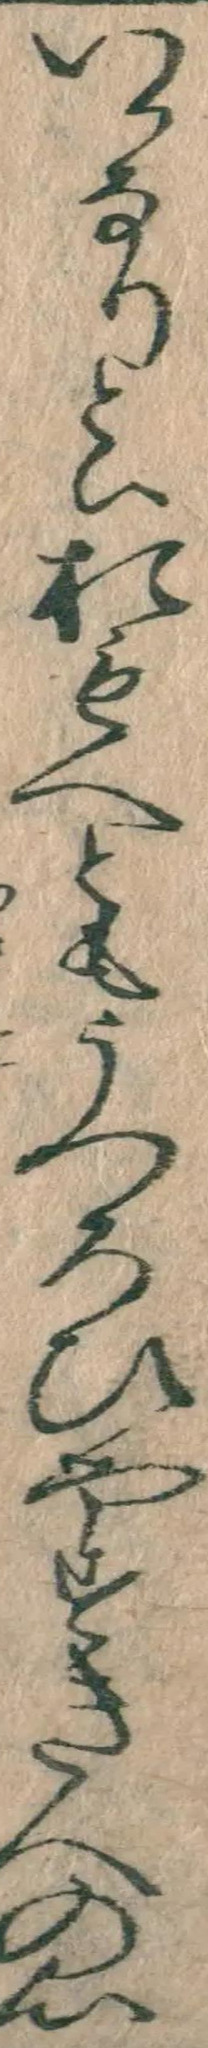いかなりとはおもへともうつろひやすき人の心
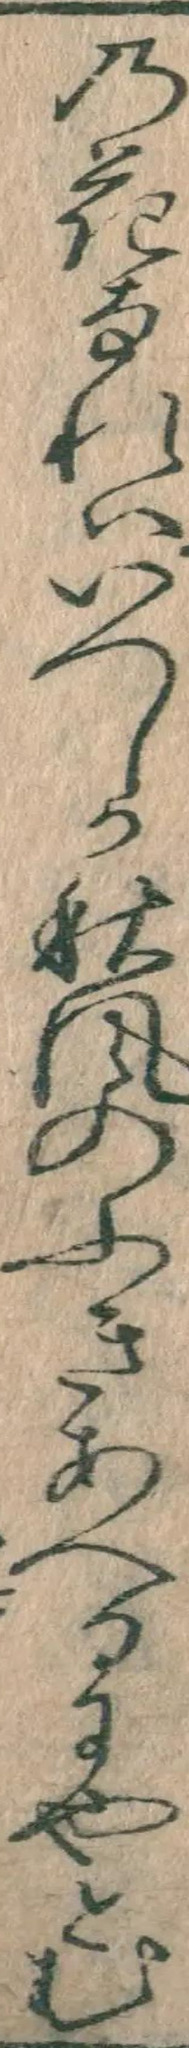の花なれは、いつしか秋風のふきあへるにやとむ
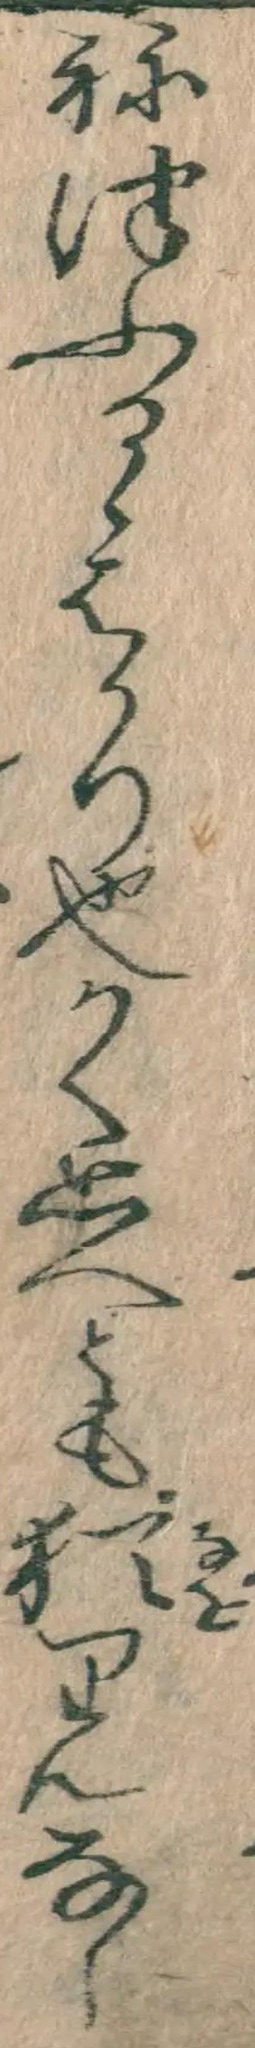ねつふるゝはかり也かく思へとも、猶りんなし
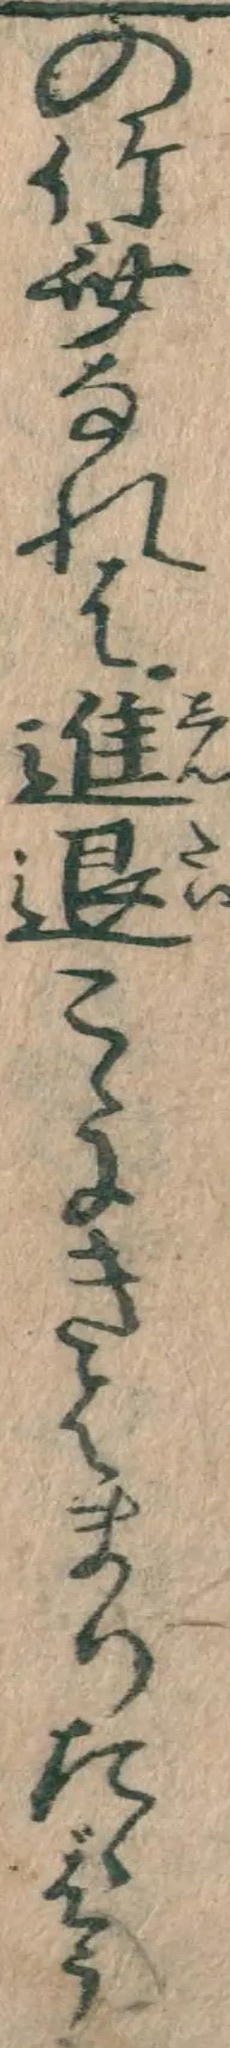の竹斎なれは、進退こゝにきはまりたゝばう

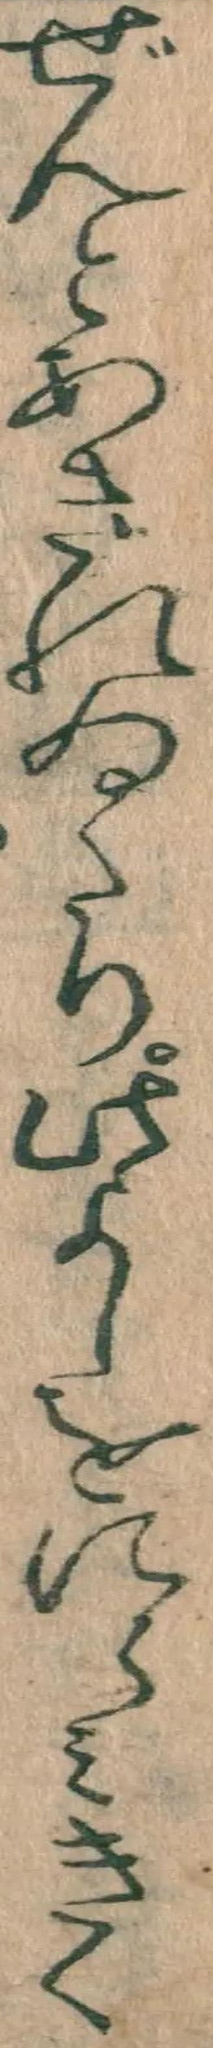ぜんとあきれゐたり。此よしをにらみきく
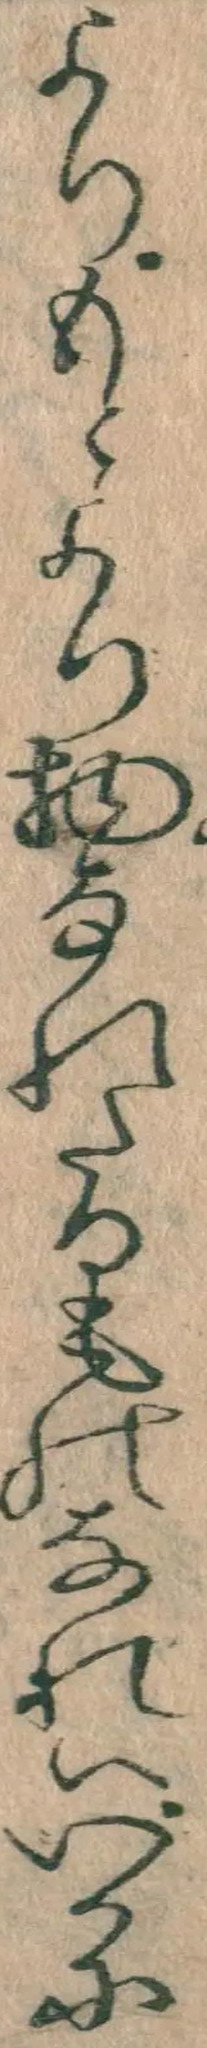より、もとより物なれたるものなれは、いかに
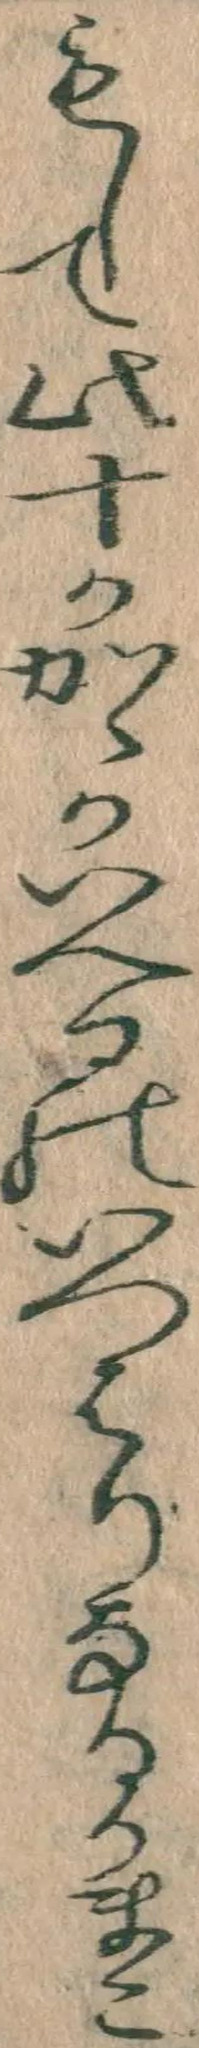もして此十かかゝかいへるのいつはりなるかまこ
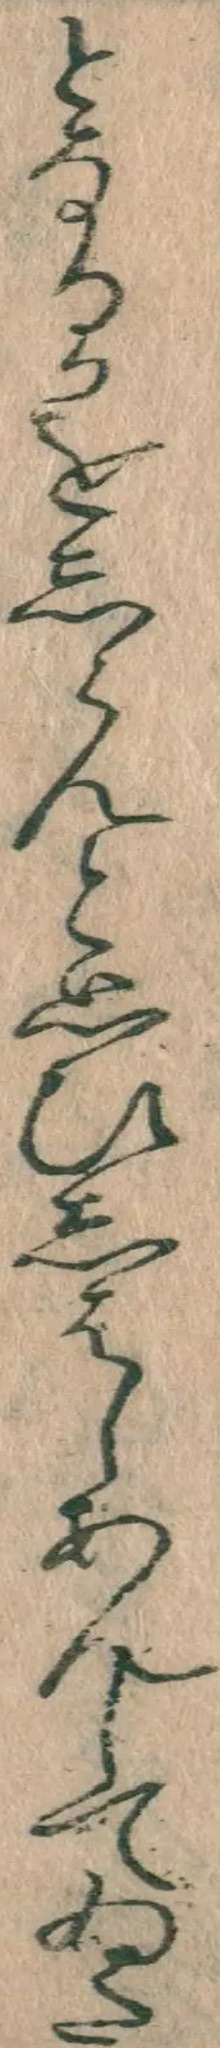となるかをしらんと思ひしはしあんしてゐた
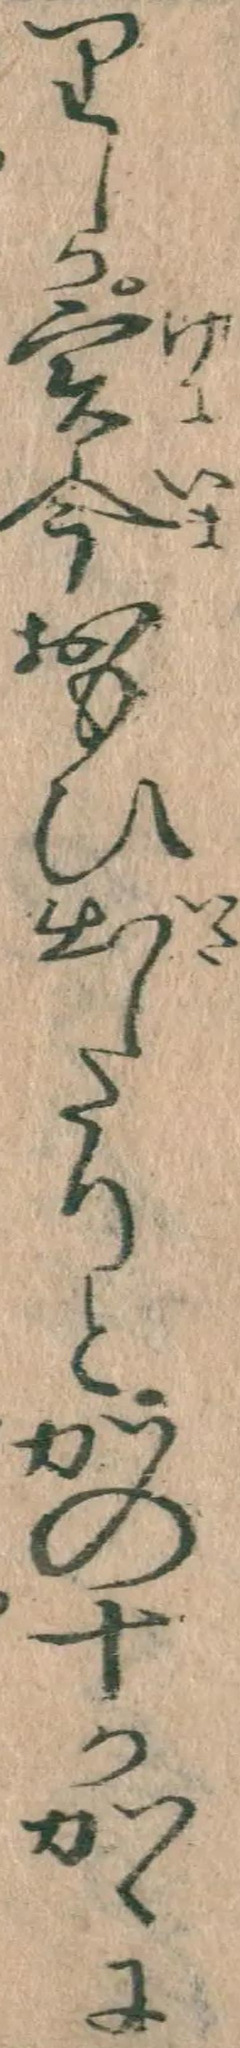りしか。実今おもひ出したりと、かの十かかゝに
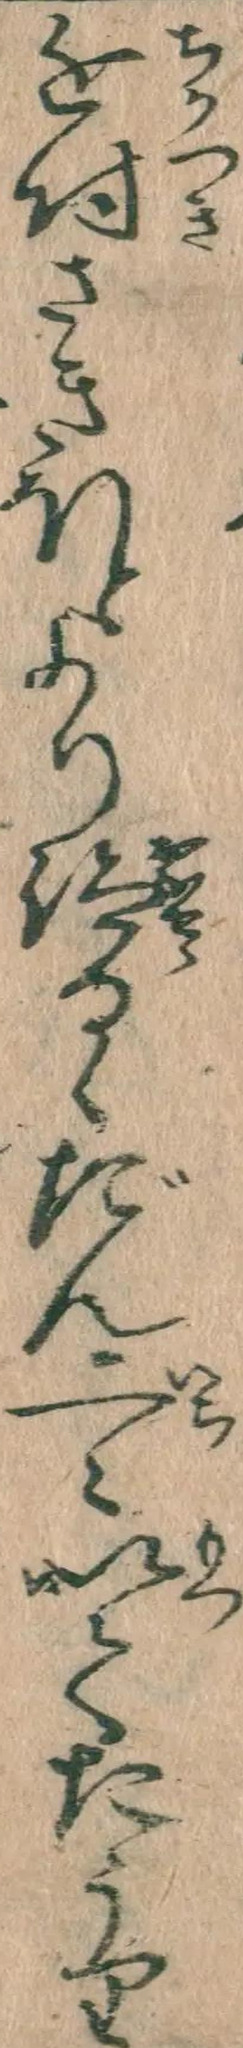近付さきほとより仰るゝだん、一々以てたうり
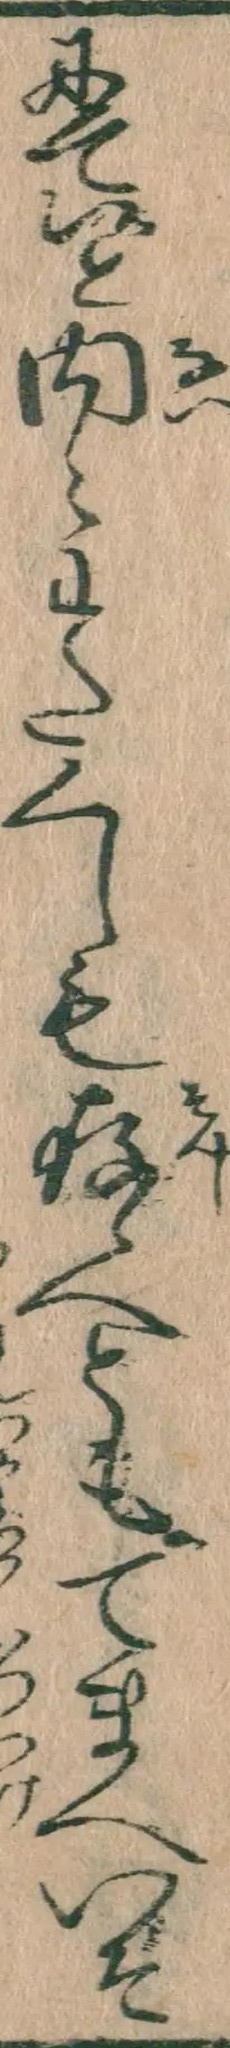にて候と内々わたくしも存候へとも、てまへいそ
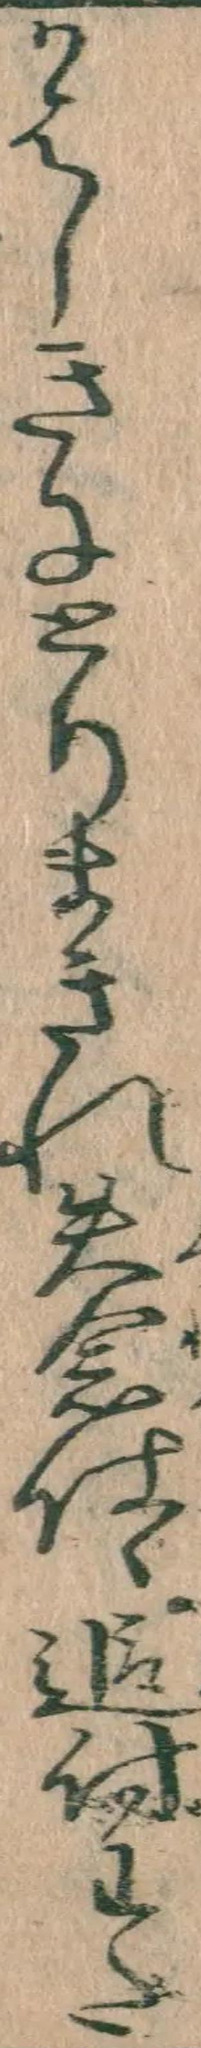かはしきにとりまきれ失念仕候、追付わた
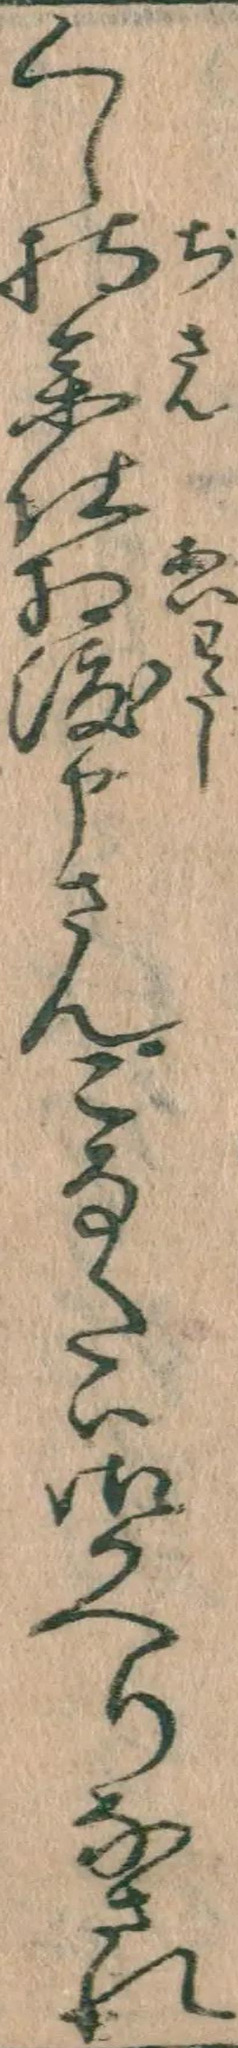くし持参仕相渡申さん、こなたは御かへりなされ
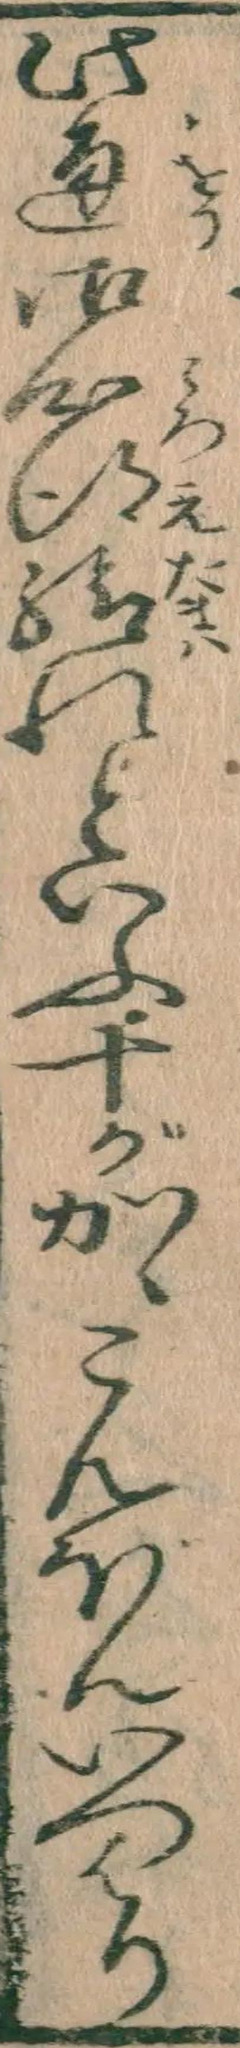此通御心得給れといふ、十がかゝこんほんいつはり
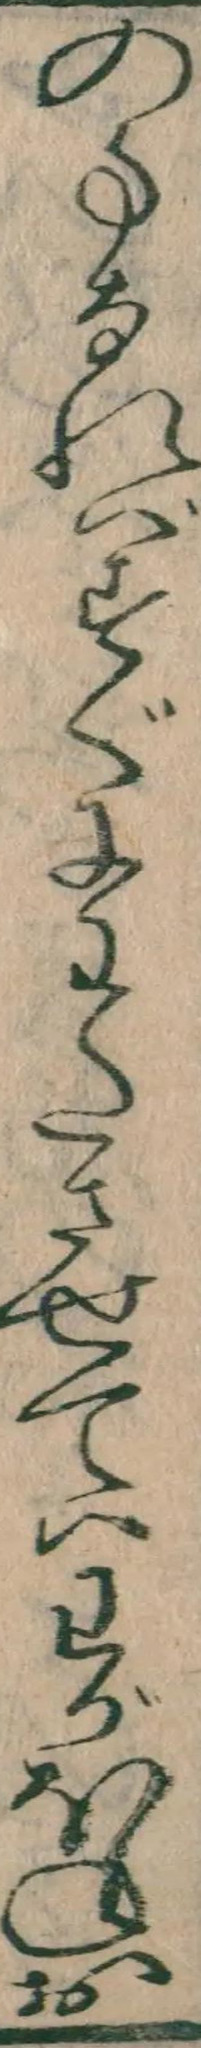の事なればすぐにわたさせてはわがほねお
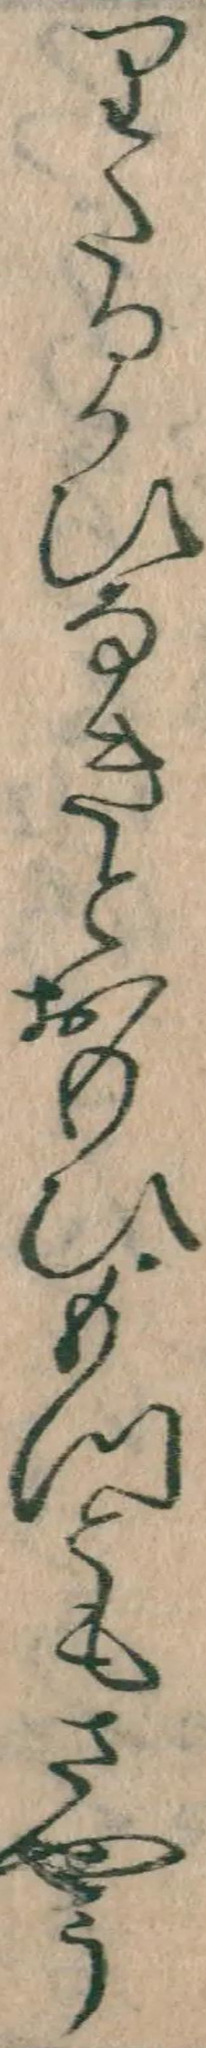りたるかひなきとおもひ、もつともさやう
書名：竹斎狂歌物語 3巻
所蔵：国立国会図書館 National Diet Library, JAPAN
